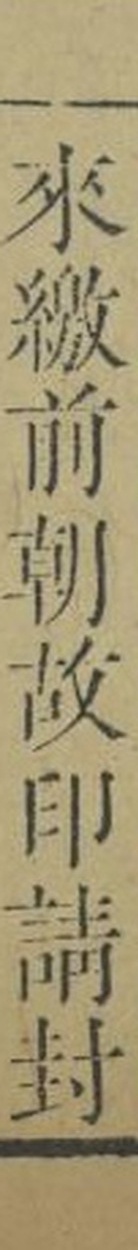來繳前朝故印請封
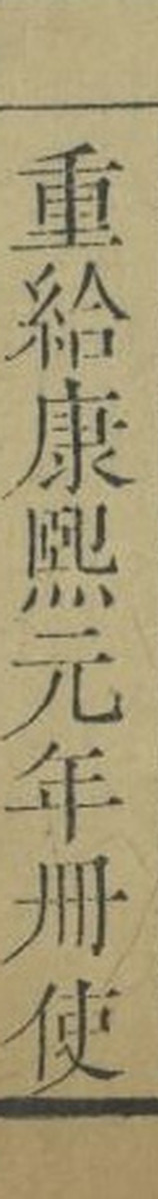重給康煕元年册使
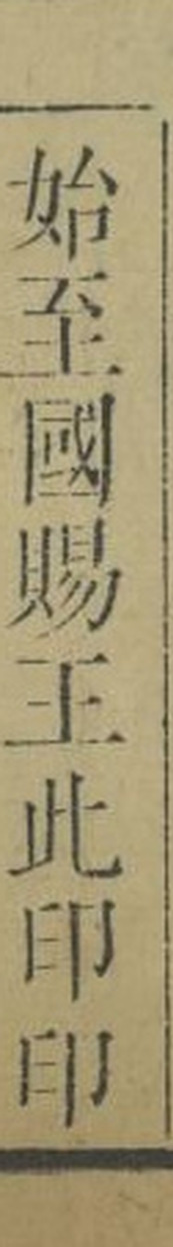始至國賜王此印印
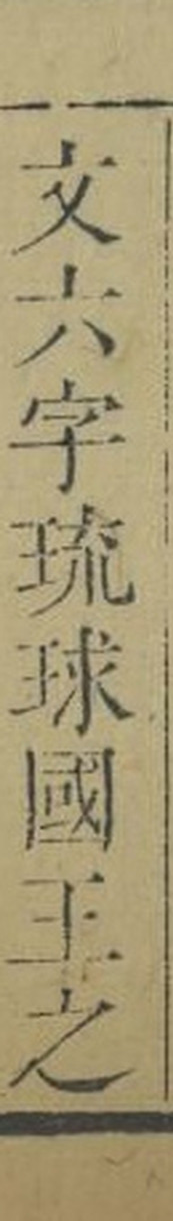文六字琉球國王之
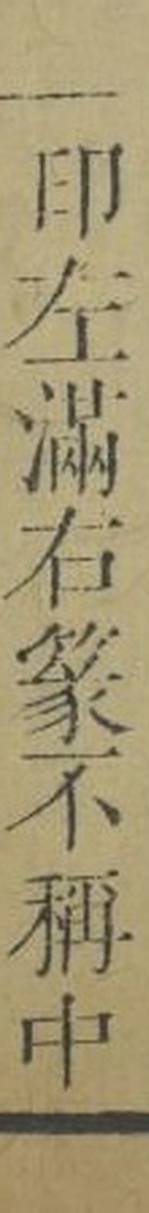印左滿右篆不稱中

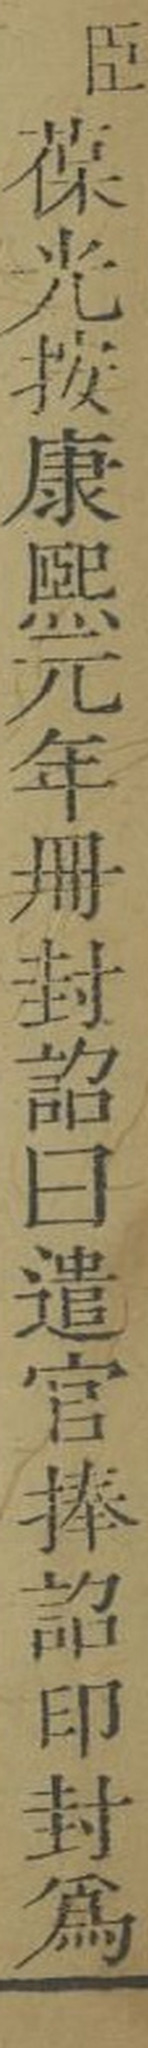臣葆光按康煕元年冊封詔曰遣官捧詔印封爲
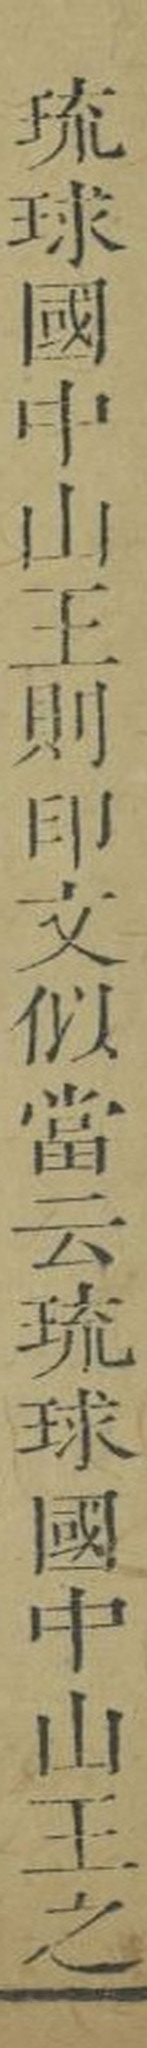琉球國中山王則印文似當云琉球國中山王之
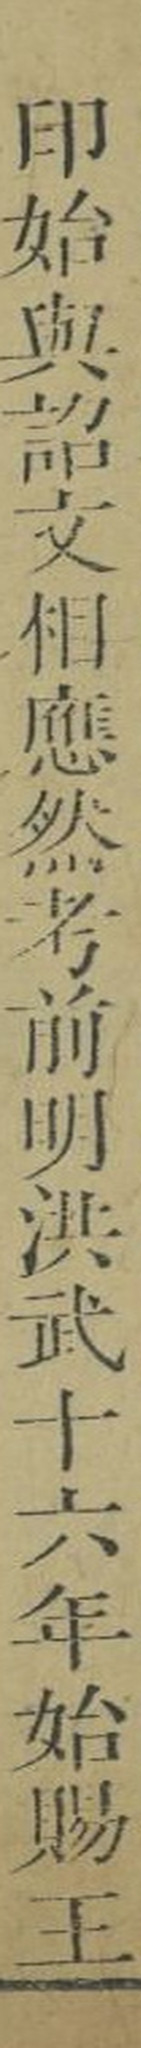印始與詔文相應然考前明洪武十六年始賜王
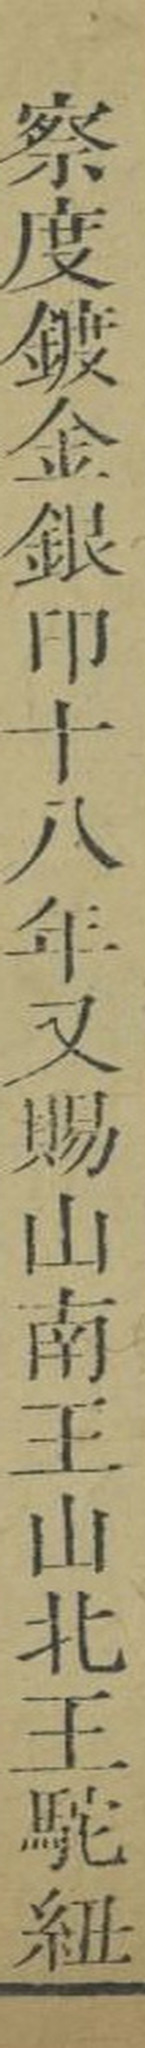察度鍍金銀印十八年又賜山南王山北王駝紐
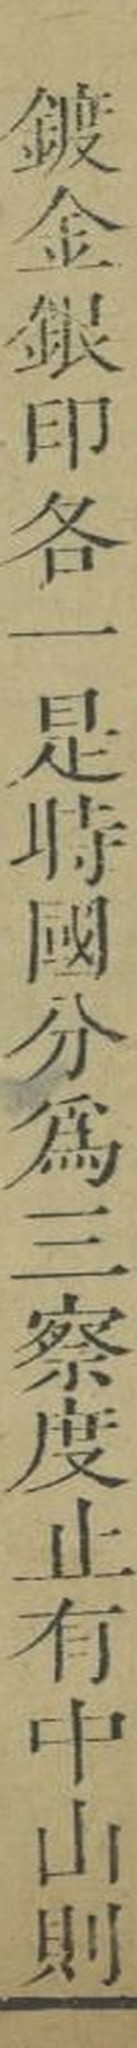鍍金銀印各一是時國分爲三察度止有中山則
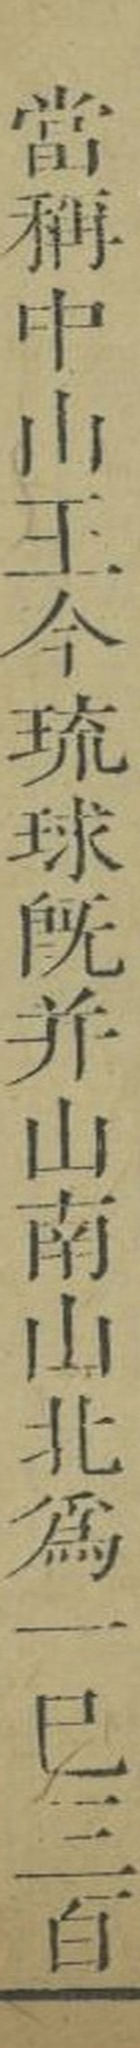當稱中山王今琉球既并山南山北爲一巳三百
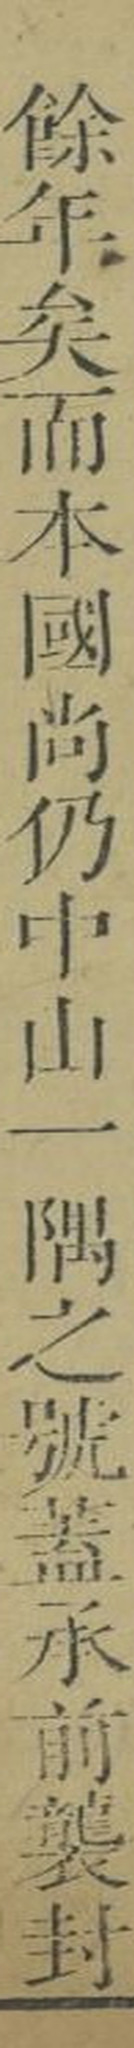餘年矣而本國尚仍中山一隅之號蓋承前襲封
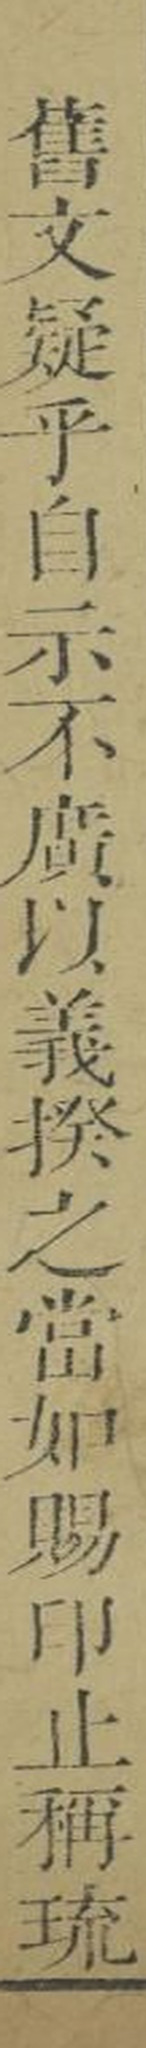舊文疑乎自示不廣以義揆之當如賜印止稱琉
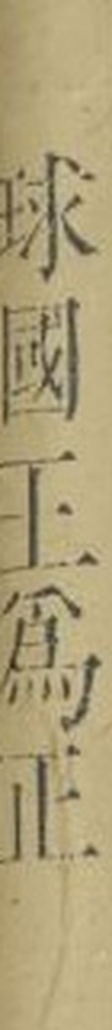球國王爲正

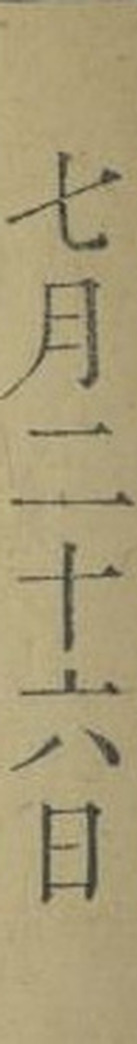七月二十六日
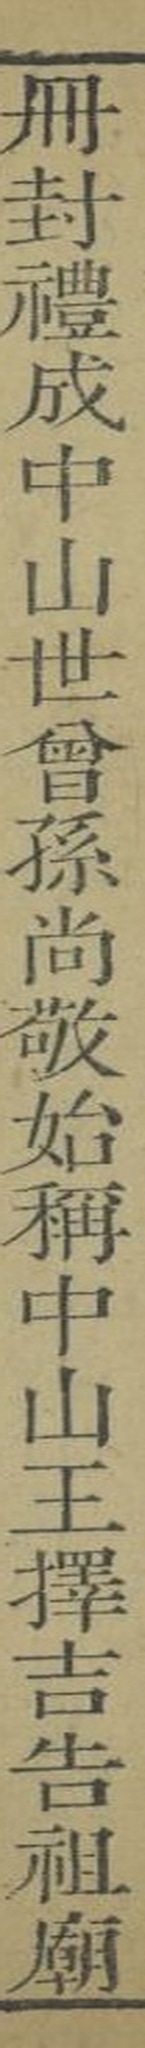冊封禮成中山世曾孫尚敬始稱中山王擇吉告祖廟
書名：中山伝信録 巻二
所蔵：University of the Ryukyus Library
